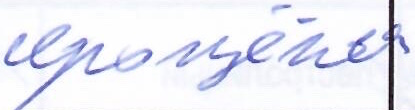сероцёкая
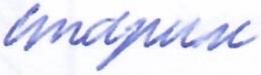старик
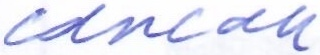сапсан
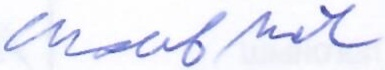скоиьня
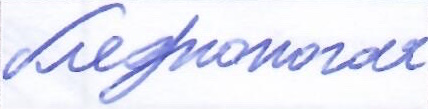бледноногая
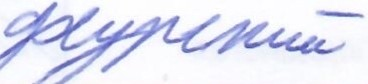даурский
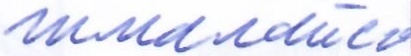гималайск
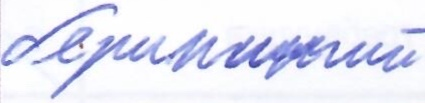берипингий
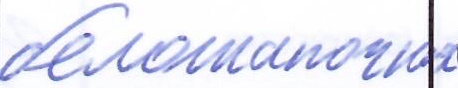белошапочня
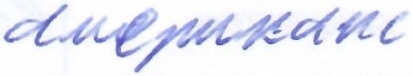американс
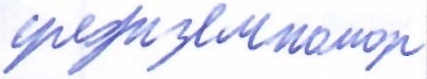средиземномор
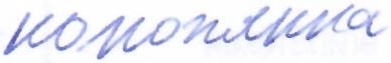конопянка
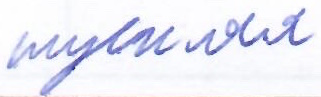тускляя
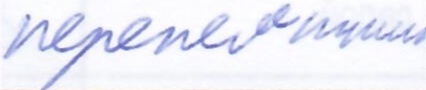перепелятник
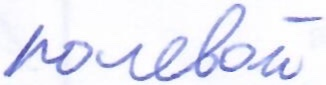полевой
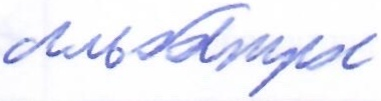альбатрос
